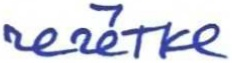чечётка
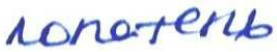лопотень
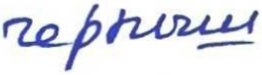черныш
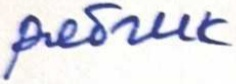рябчик
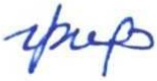гриф
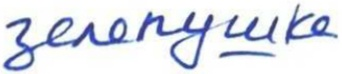зелепушка
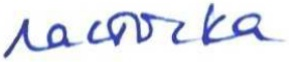ласточка
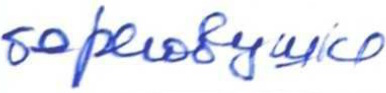береговушка
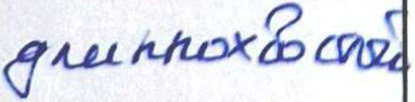длиннохвостый
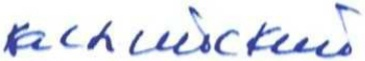каспийский
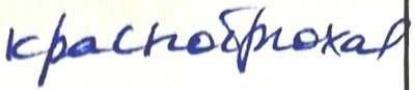краснобрюхая
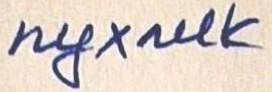пухлик
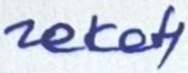чекон
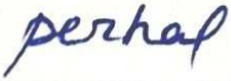речная
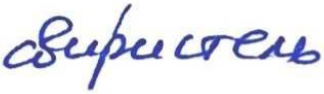свиристель
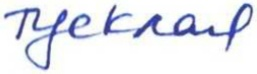тусклая
